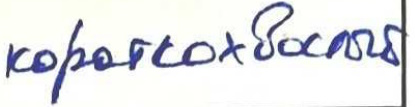короткохвостый
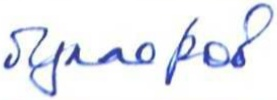буллоров
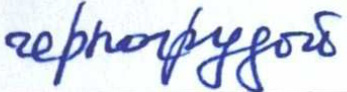черногрудый
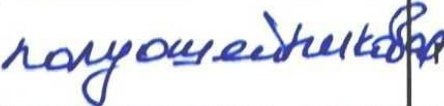полуошейникова
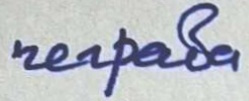чеграва
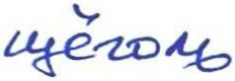щёголь
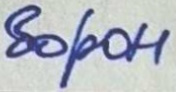ворон
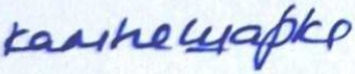камнешарке
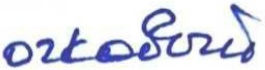очковый
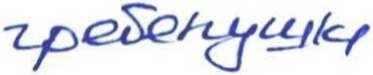гребенушка
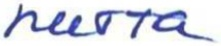питта
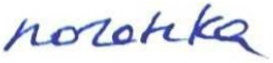погонка
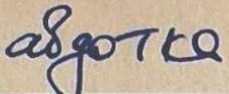авдотка
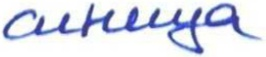синица
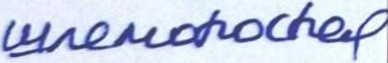шлемоносная
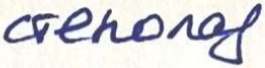стенолаз
